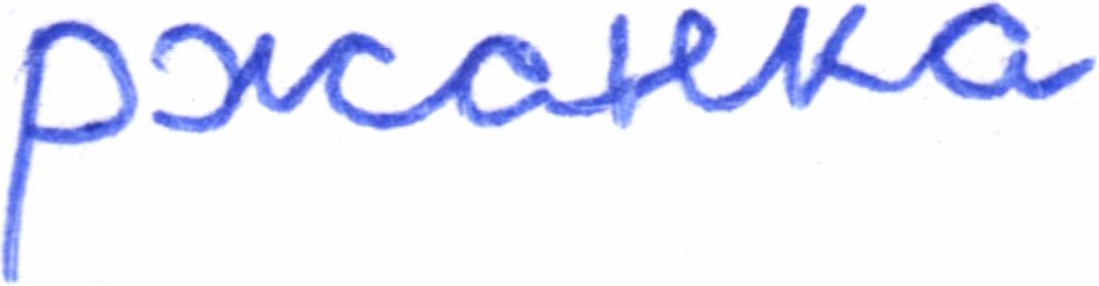ржанка
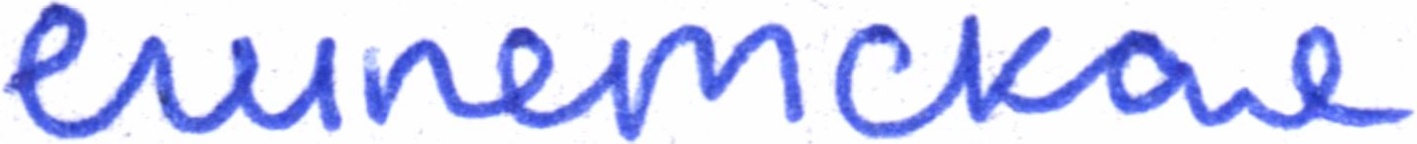египетская
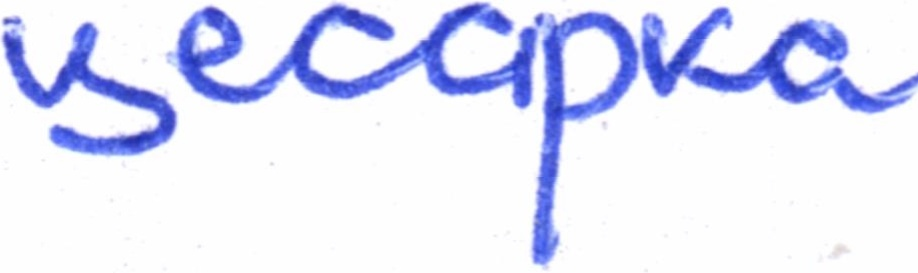цесарка
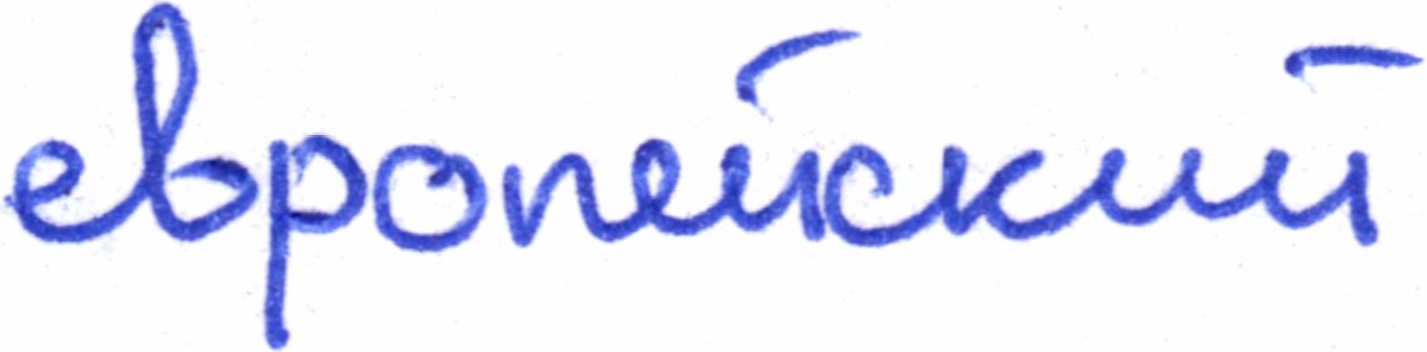европейский
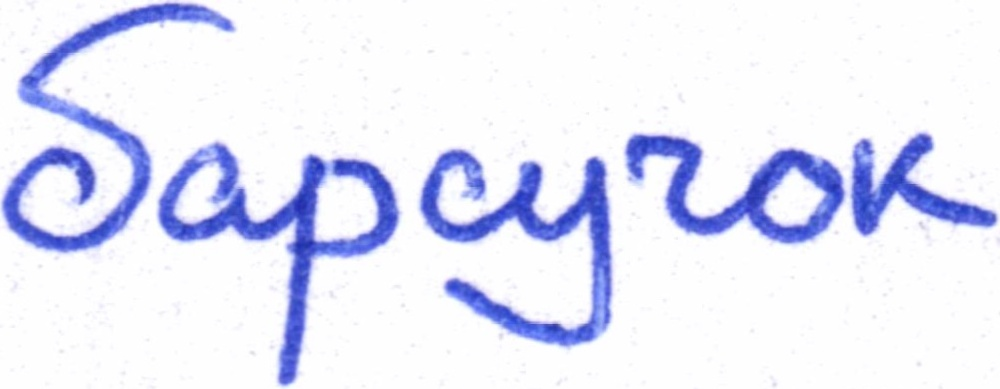барсучок
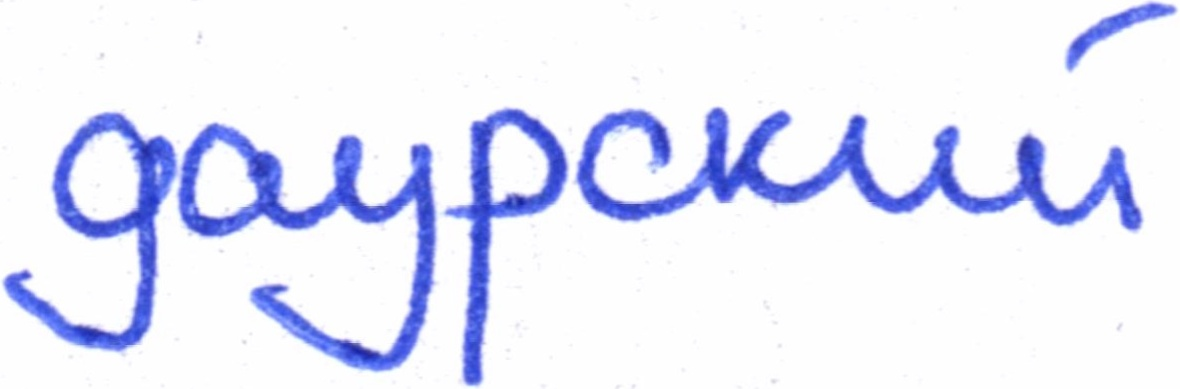даурский
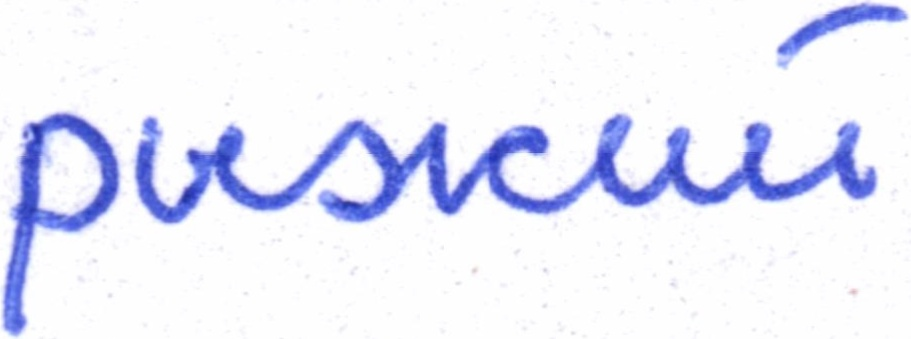рыжий
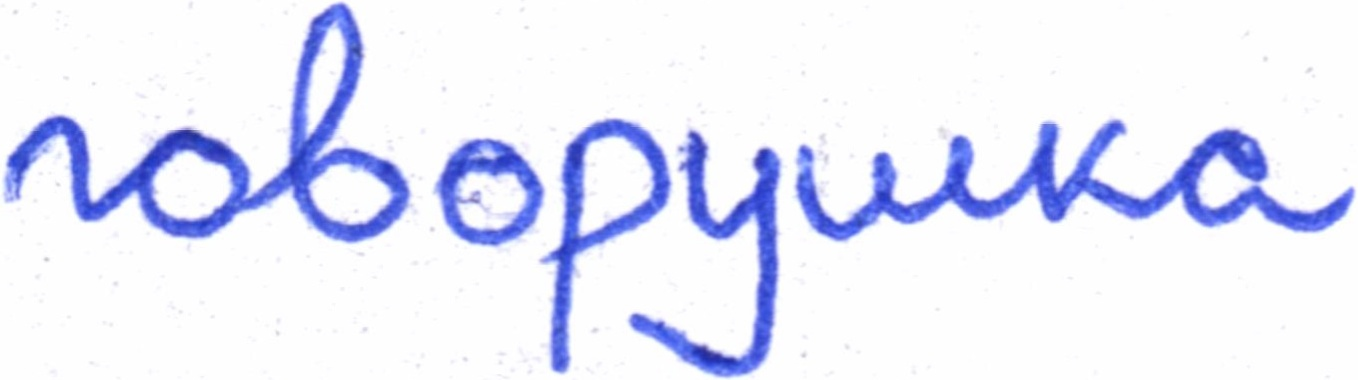говорушка
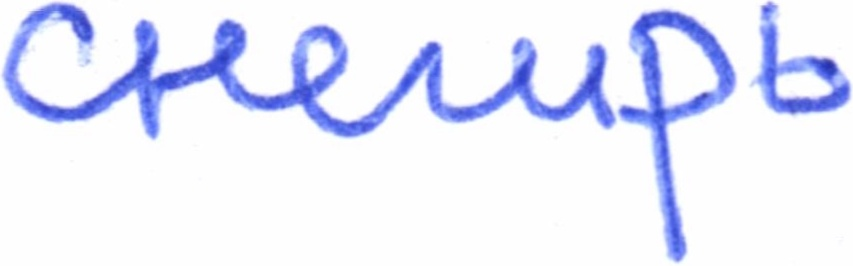снегирь
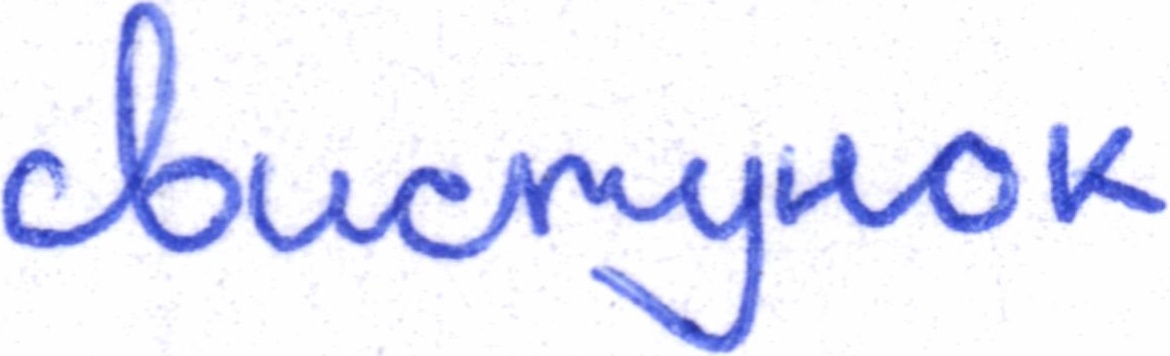свистунок
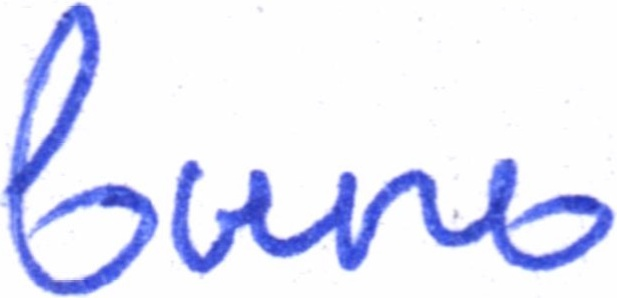выпь
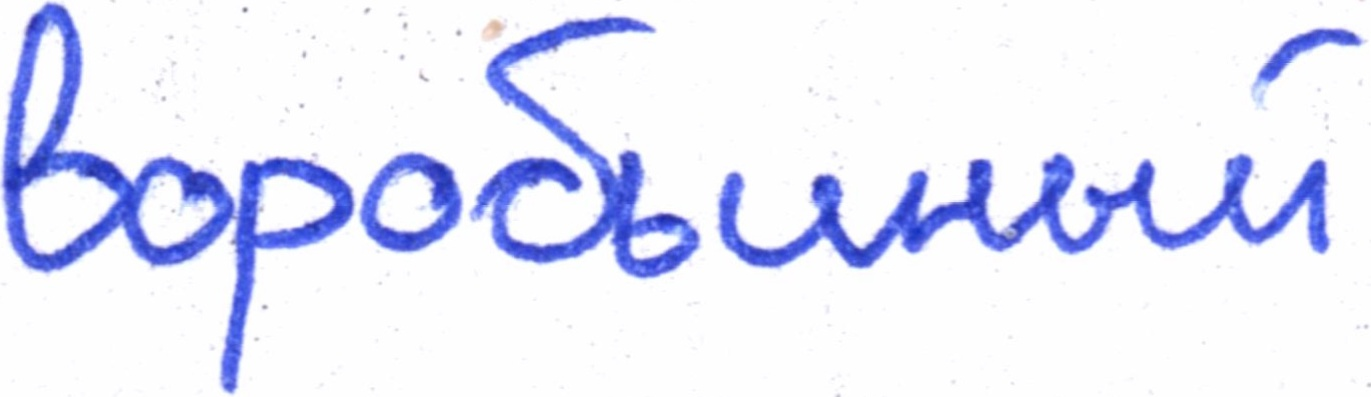воробьиный
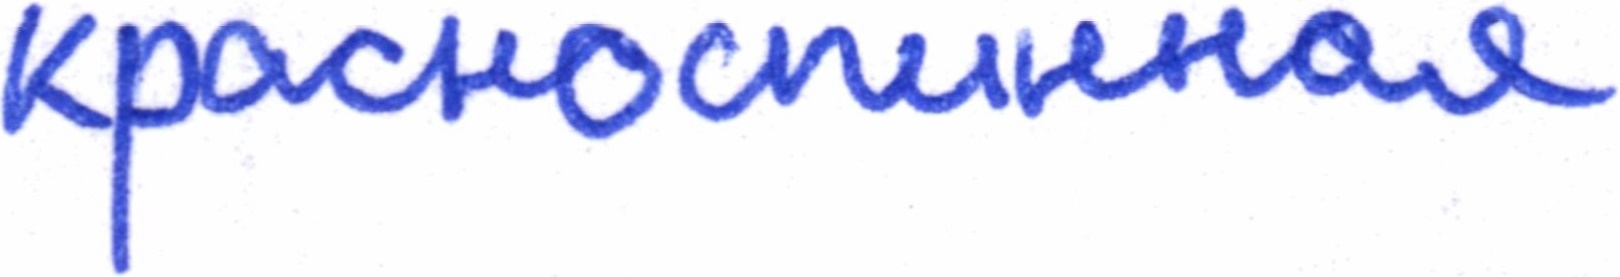красноспинная
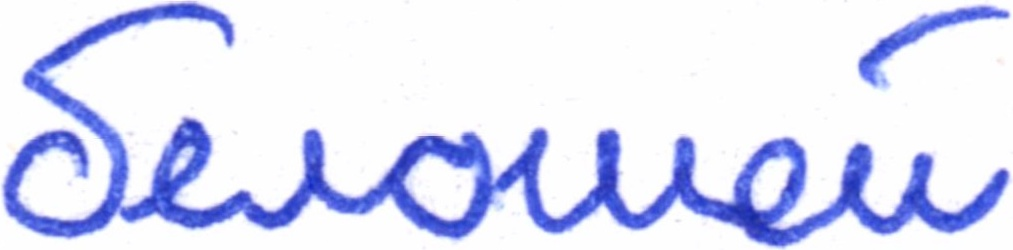белошей
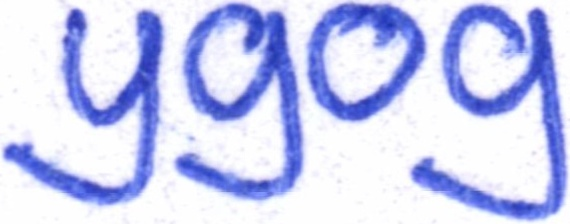удод
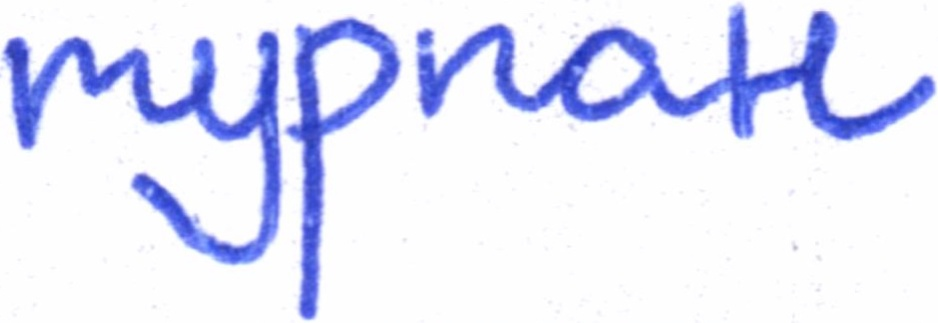турпан
